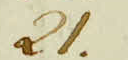21.
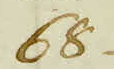68
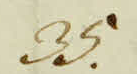35.
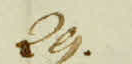29.
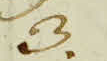3.
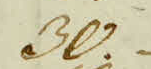30.
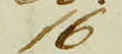16
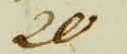20
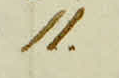11.
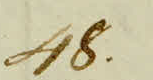48.
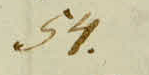54.
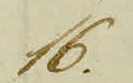16.
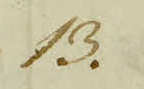13.
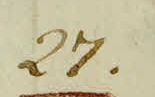27.
